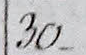30
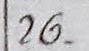26
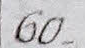60
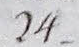24
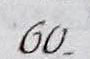60
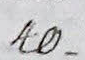40
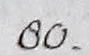80
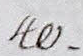40
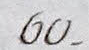60
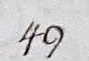49
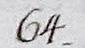64
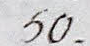50
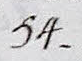54
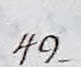49
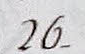26
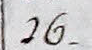26
